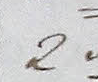2
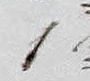1
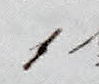1
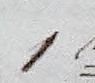1
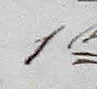1
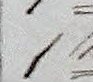1
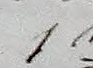1
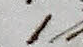1
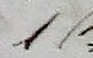1
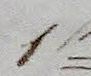1
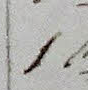1
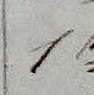1
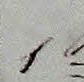1
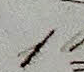1
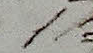1
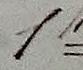1
